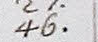46.
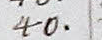40.
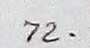72
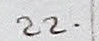22
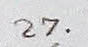27
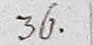36.
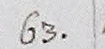63.
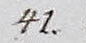41.
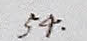54
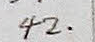42
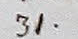31
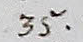35
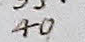40
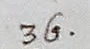36
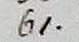61
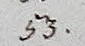53
